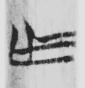乍
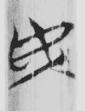𡚦
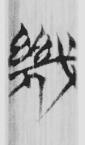幾
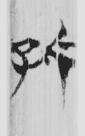孤
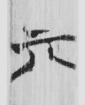亓
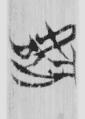{足欠}
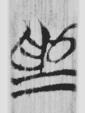爲
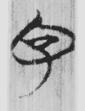免
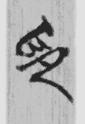卬
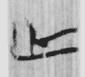亡
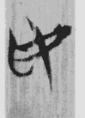女
